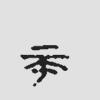帀
